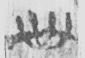卌
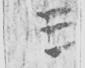三
